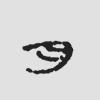月
